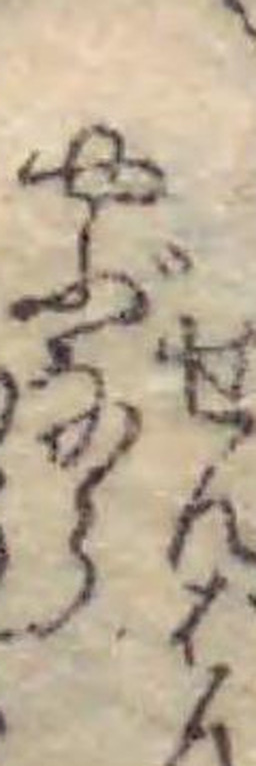やぶなら
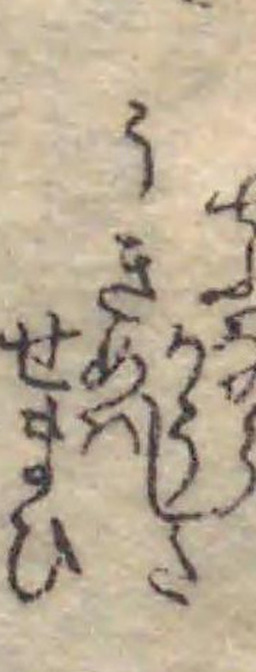うきめは
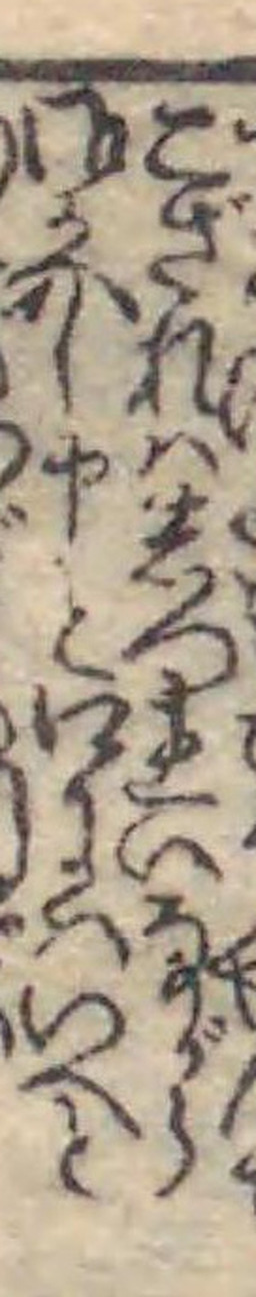御かへし申と口にはいへと
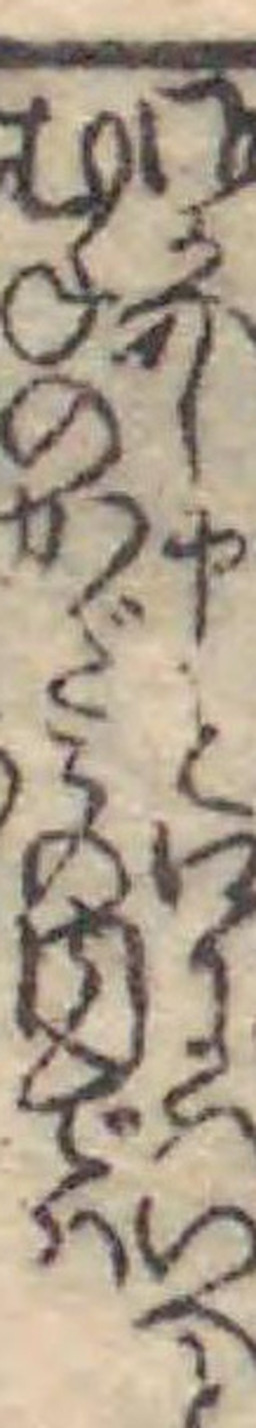むねのかゞみの内では
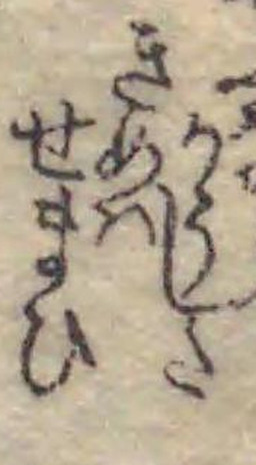せまひ
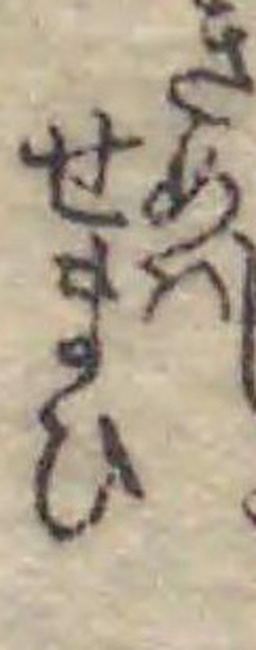せまひ
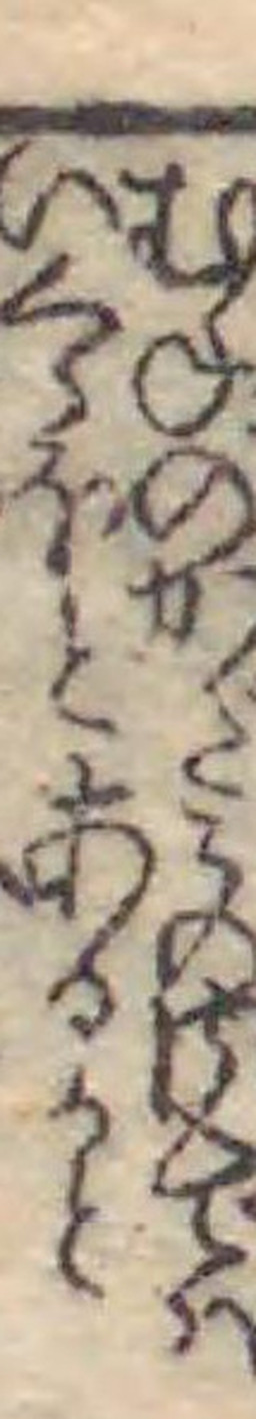いくらほとあるかと
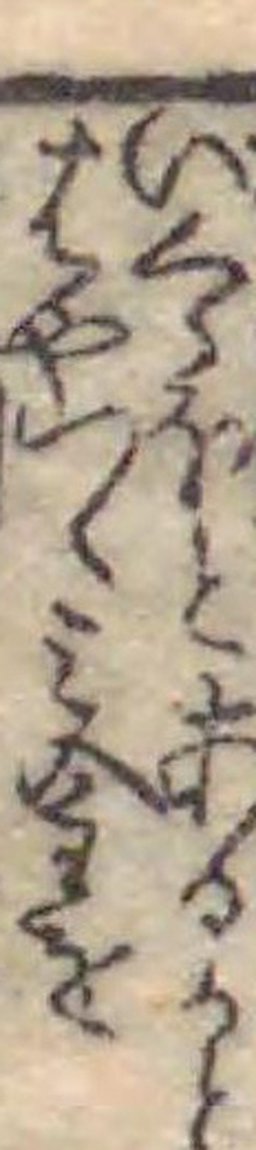はやつゝみ金を
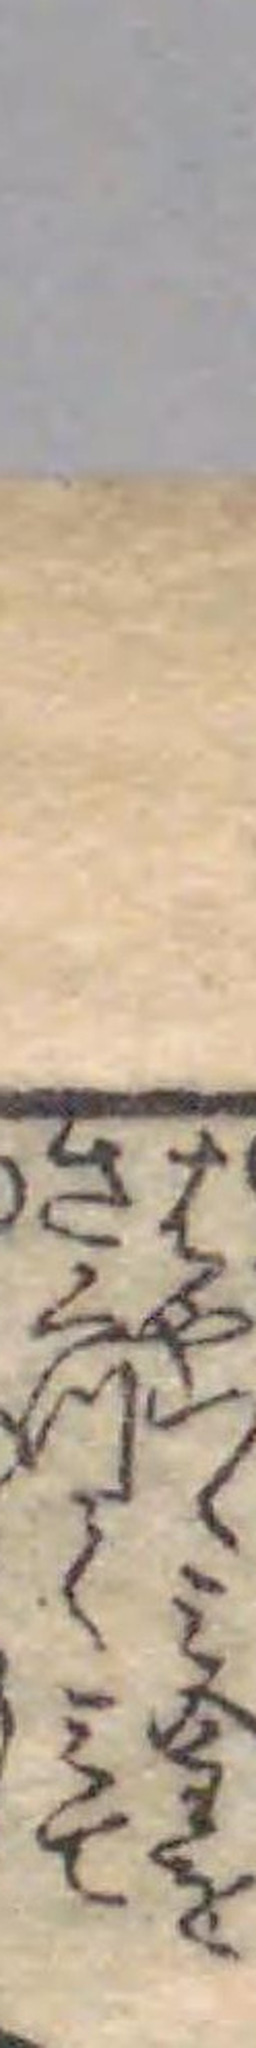さくつてみて
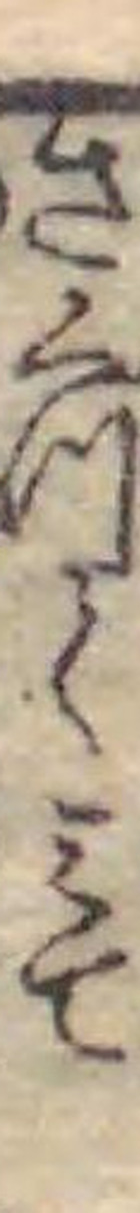さくつてみて
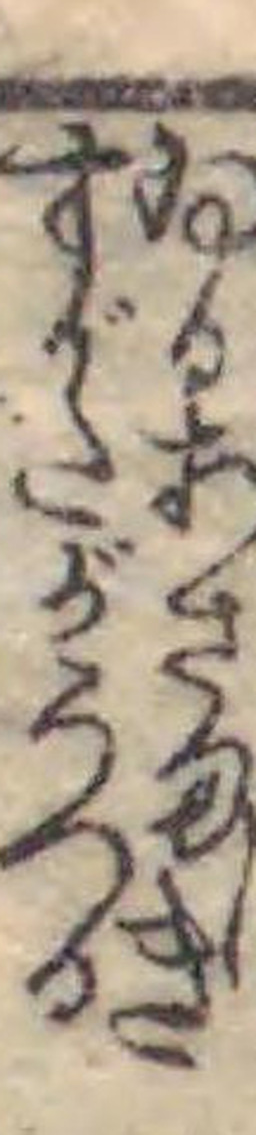すがたがうつる
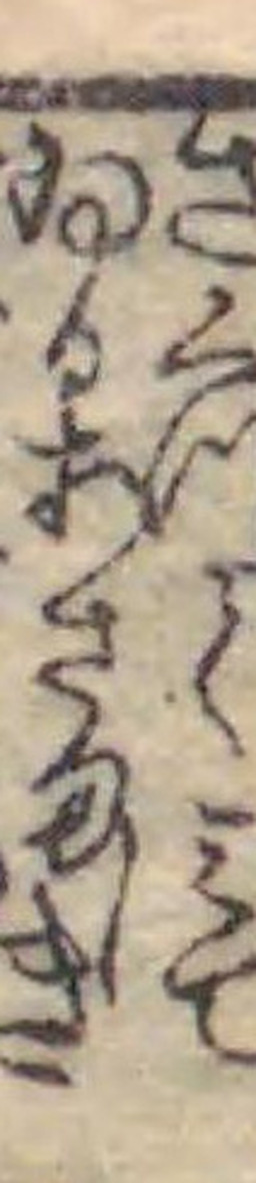ゐるあさましき
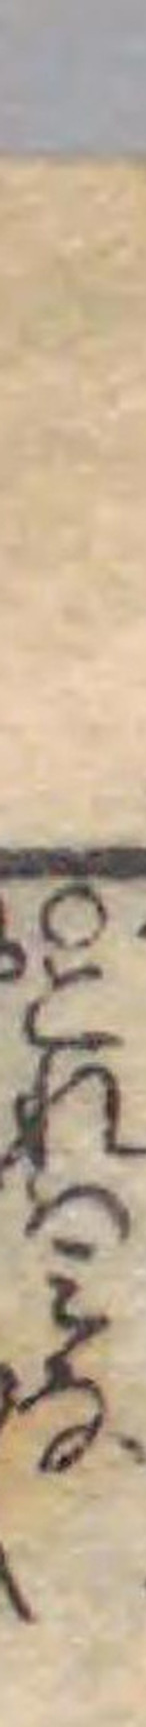○これはみな
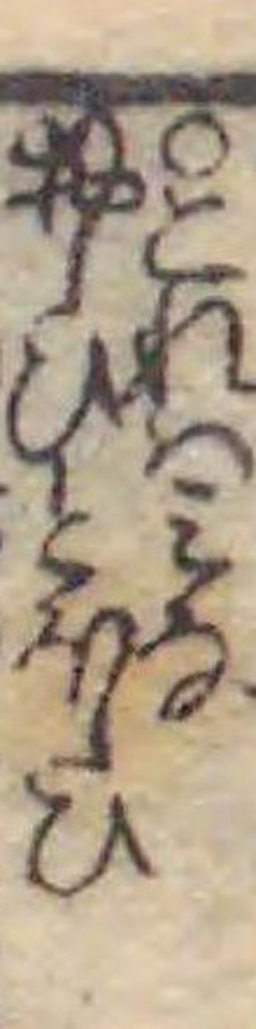おしひとほしひ
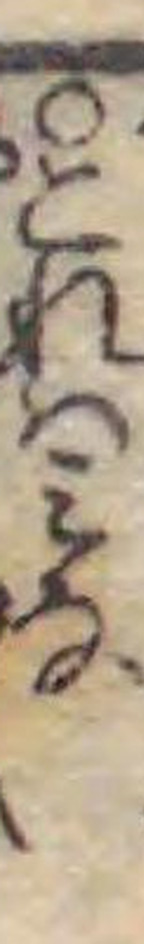○これはみな
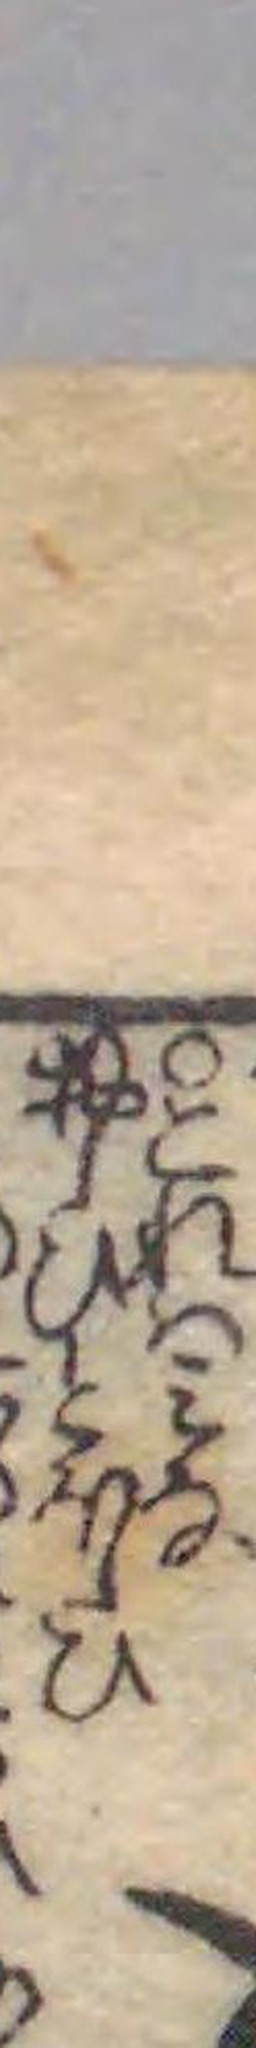おしひとほしひ
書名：人心鏡写絵 : 3巻
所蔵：国立国会図書館 National Diet Library, JAPAN
